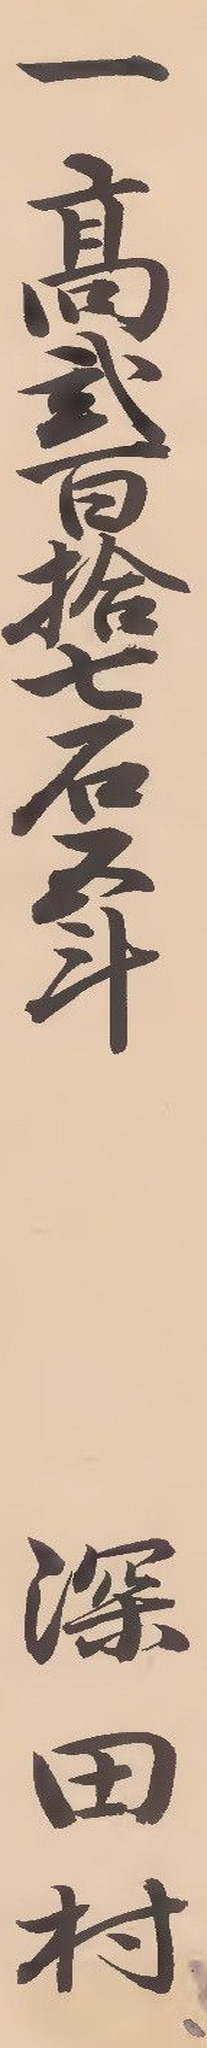一高弐百拾七石五斗深田村
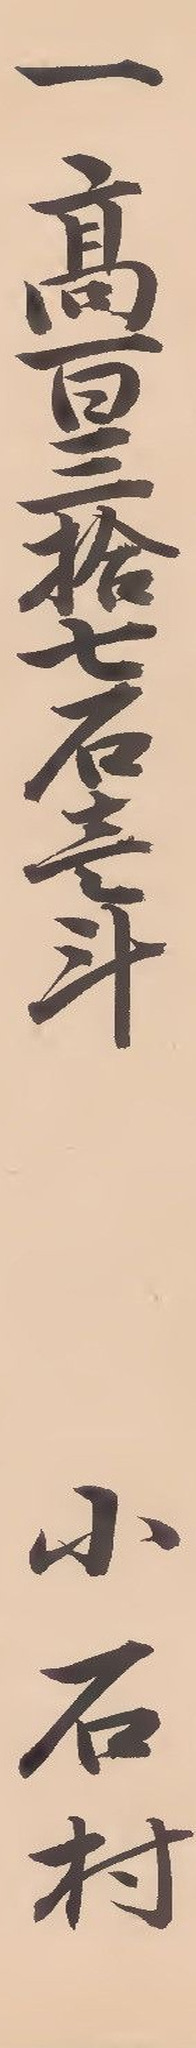一高百三拾七石壱斗小石村
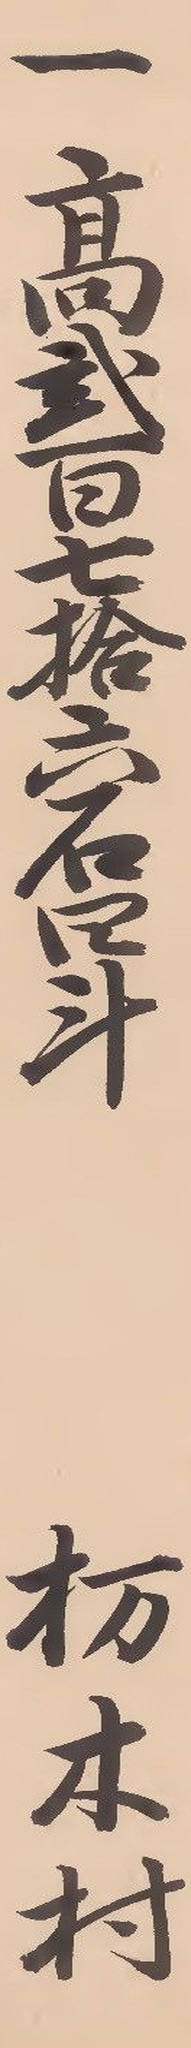一高弐百七拾六石四斗栃木村

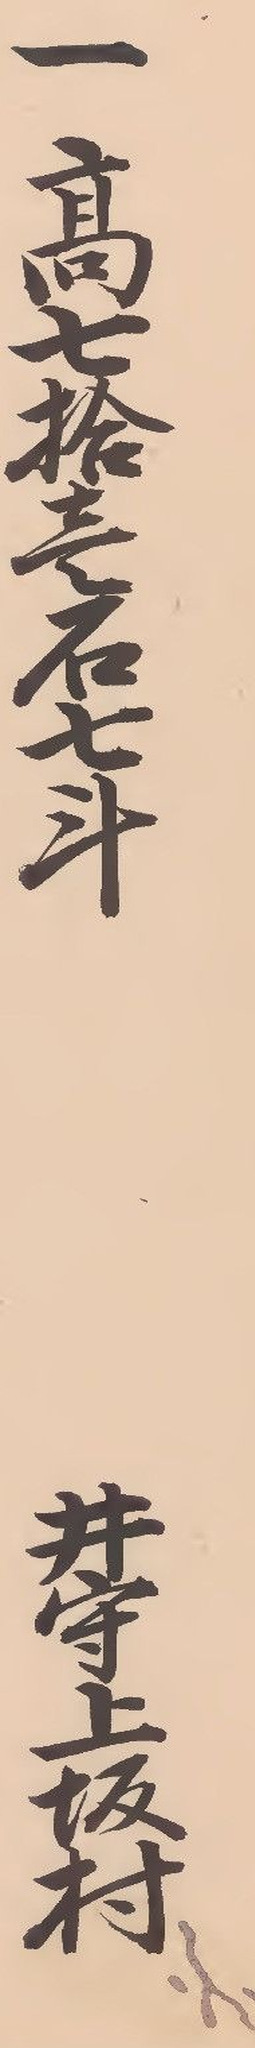一高七拾壱石七斗井守上坂村
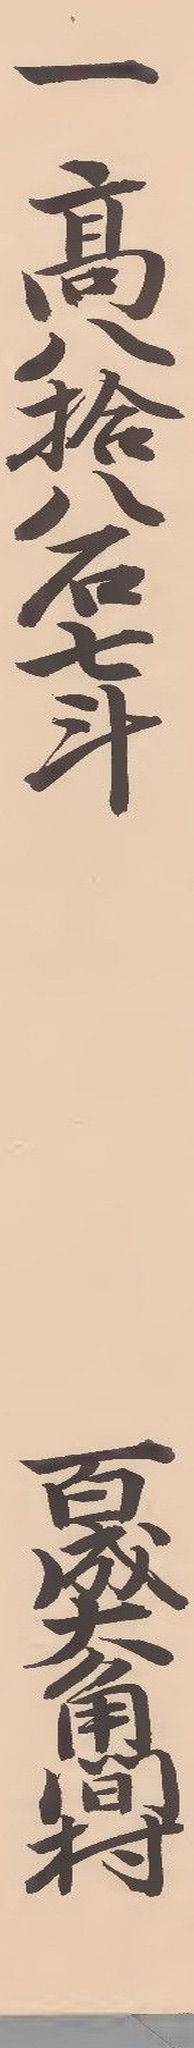一高八拾八石七斗百成大角間村
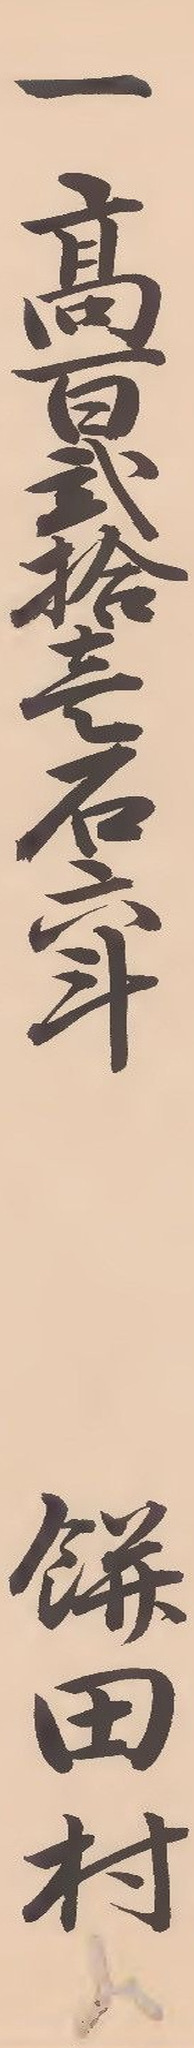一高百弐拾壱石六斗餅田村
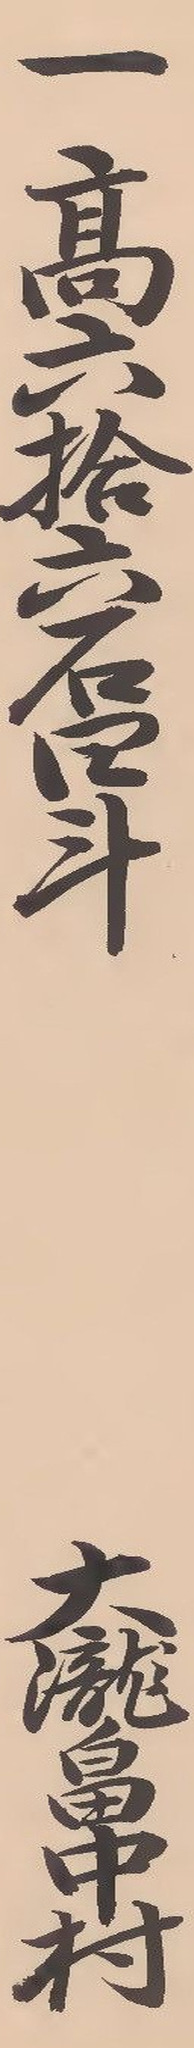一高六拾六石四斗大滝畠中村
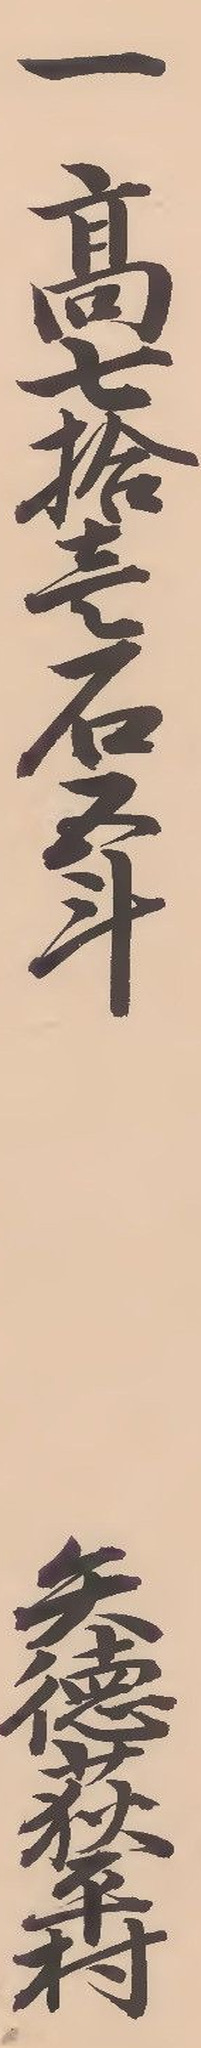一高七拾壱石五斗矢徳荻平村

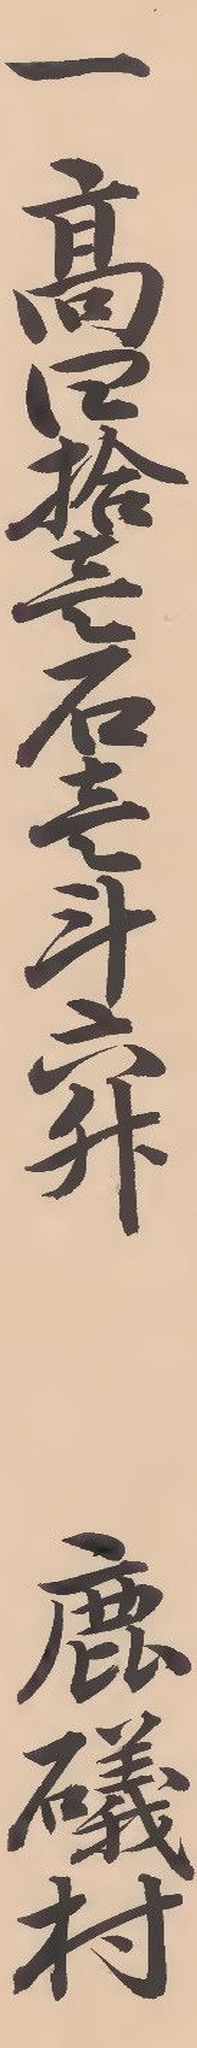一高四拾壱石壱斗六升鹿磯村
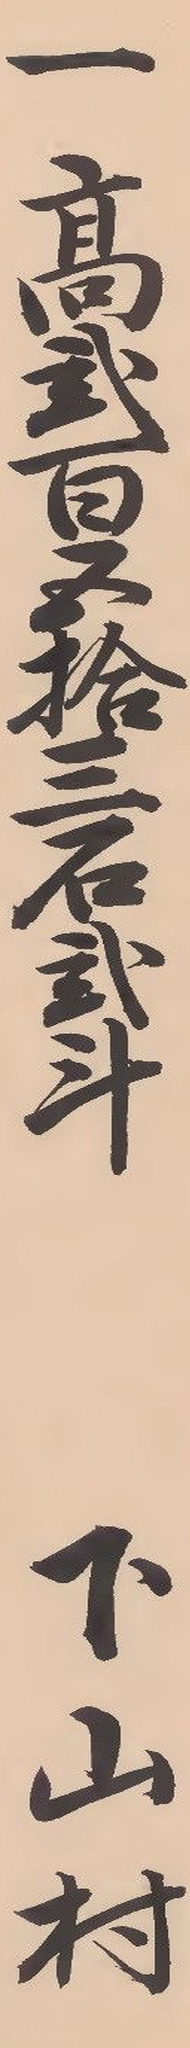一高弐百五拾三石弐斗下山村
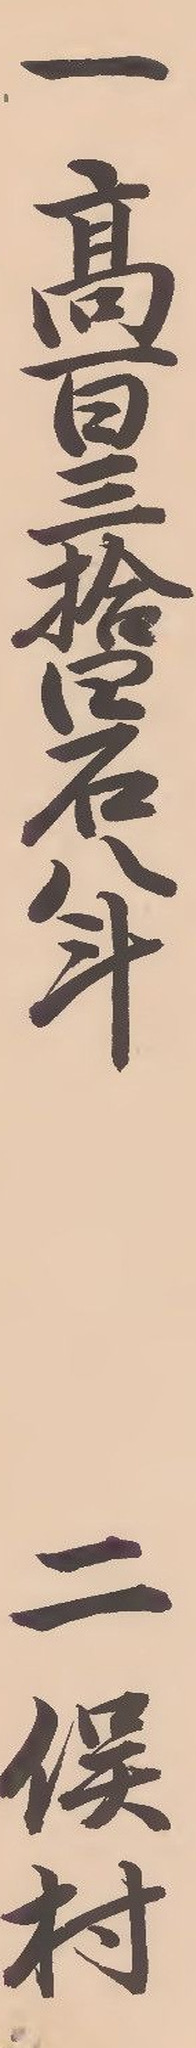一高百三拾四石八斗二俣村

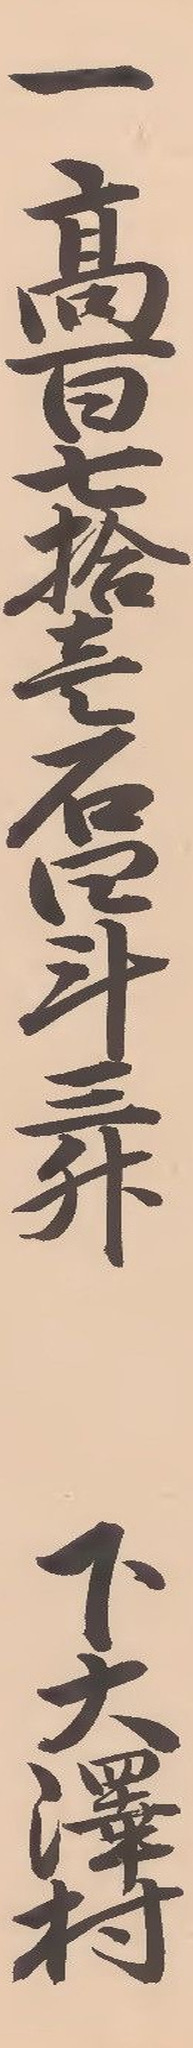一高百七拾壱石四斗三升下大沢村
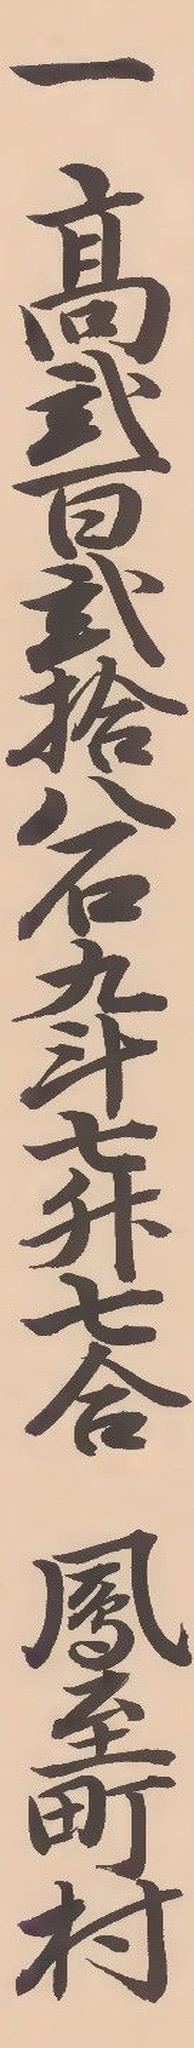一高弐百弐拾八石九斗七升七合鳳至町村
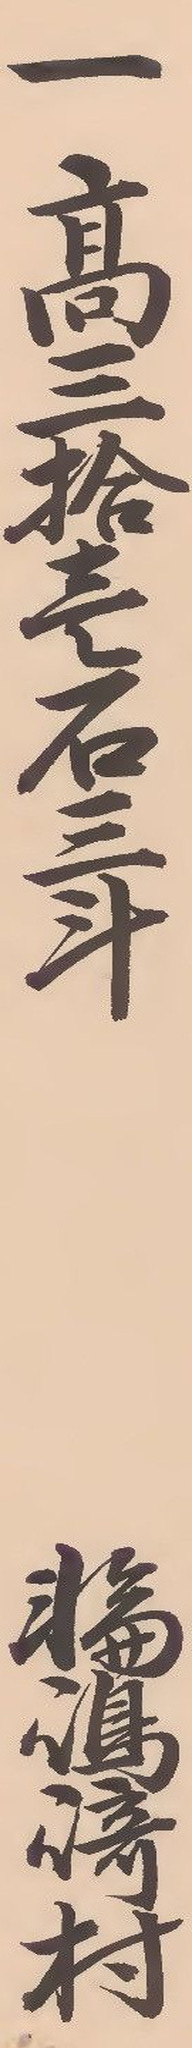一高三拾壱石三斗輪島崎村

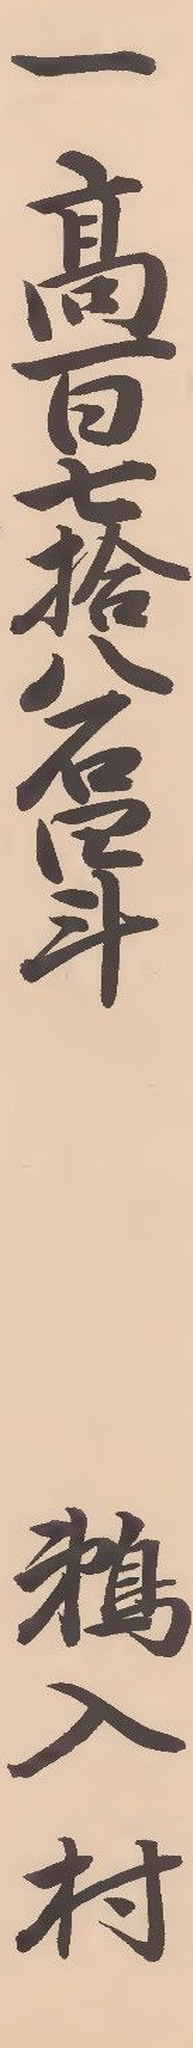一高百七拾八石四斗鵜入村
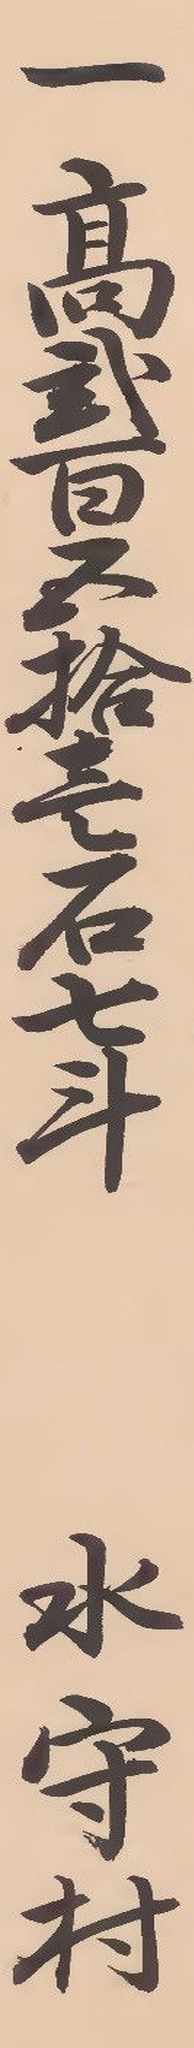一高弐百五拾壱石七斗水守村
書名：能登国郷帳
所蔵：国立公文書館 National Archives of Japan
